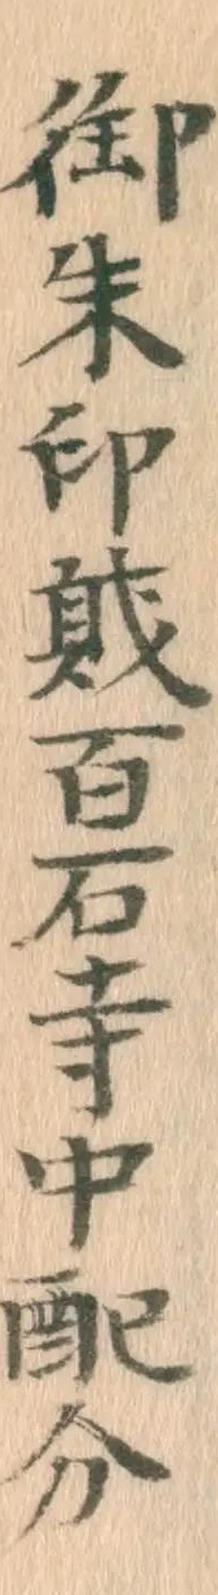御朱印弐百石寺中配分
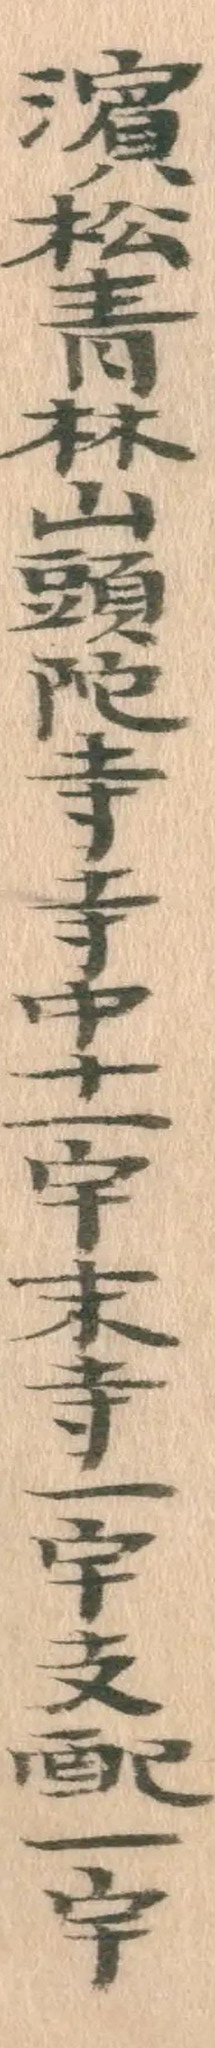浜松青林山頭陀寺寺中十一宇未寺一宇支配一宇
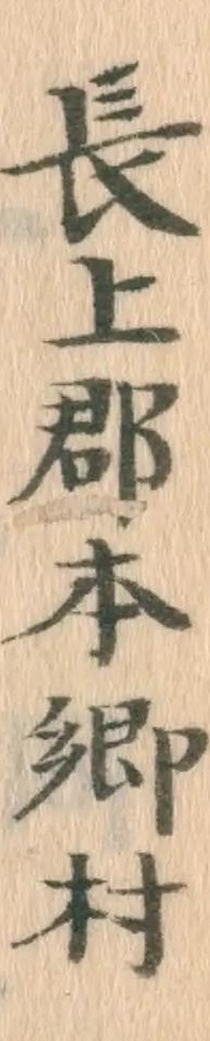長上郡本郷村
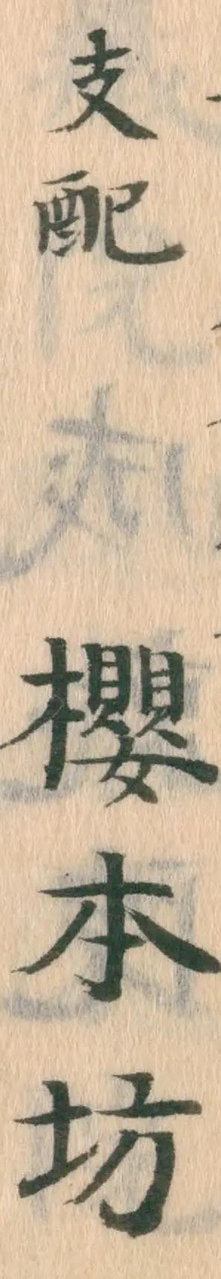支配桜本坊
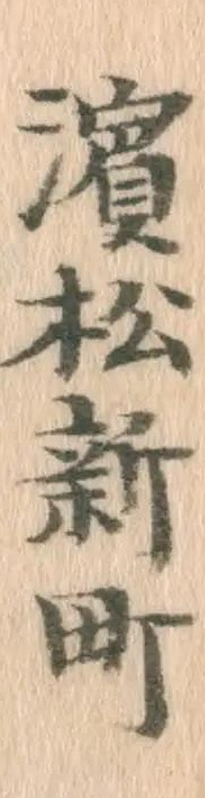浜松新町
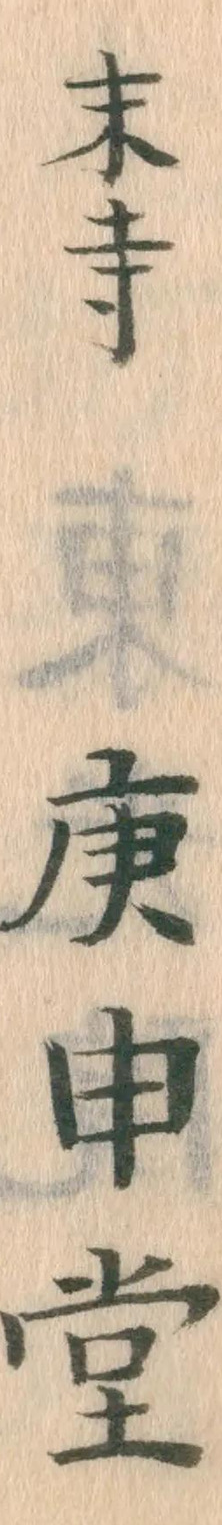未寺庚申堂
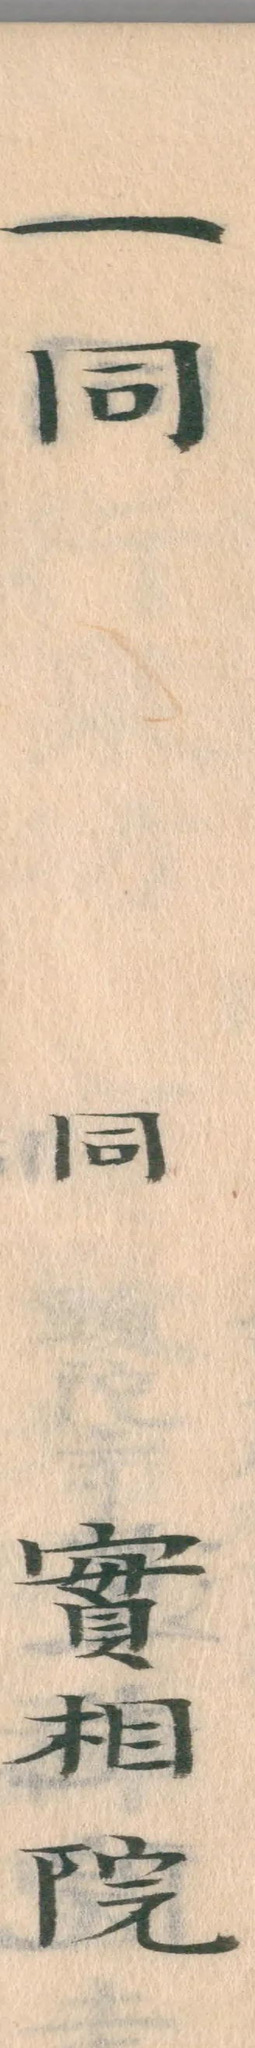一同同實相印
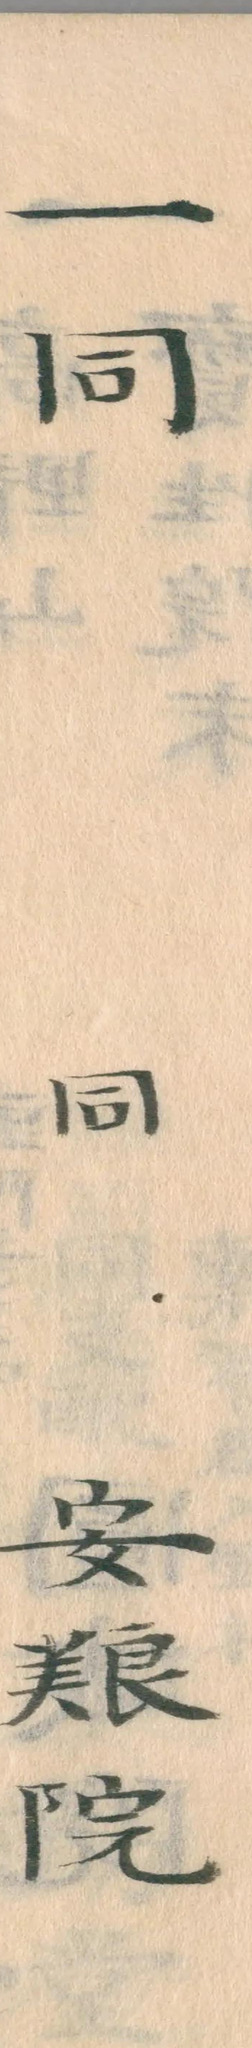一同同安羪院

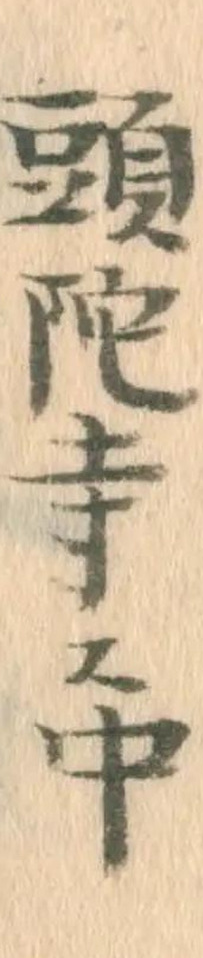頭陀寺々中
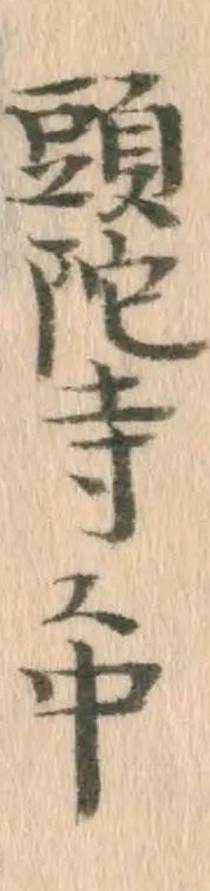頭陀寺々中
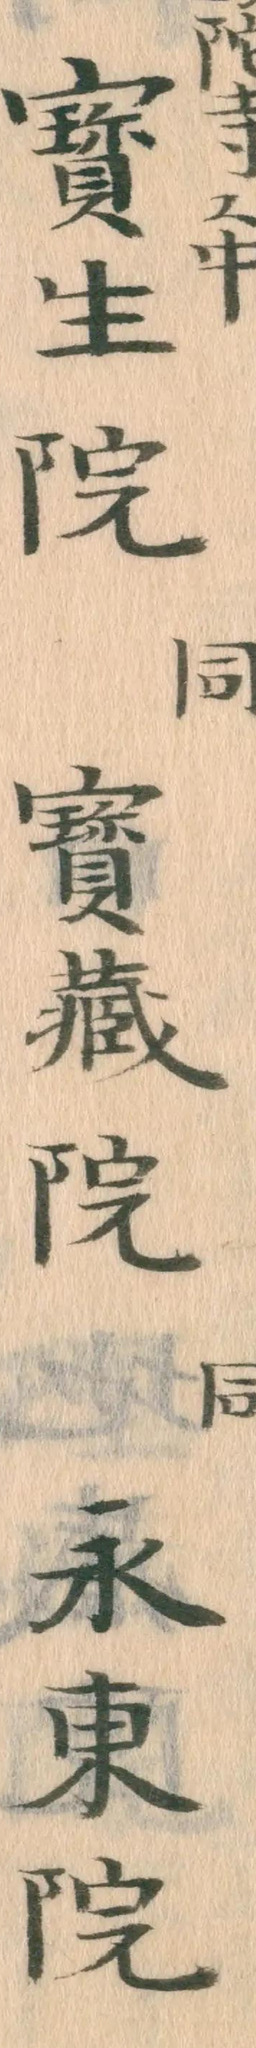寶生院宝蔵院永東寺
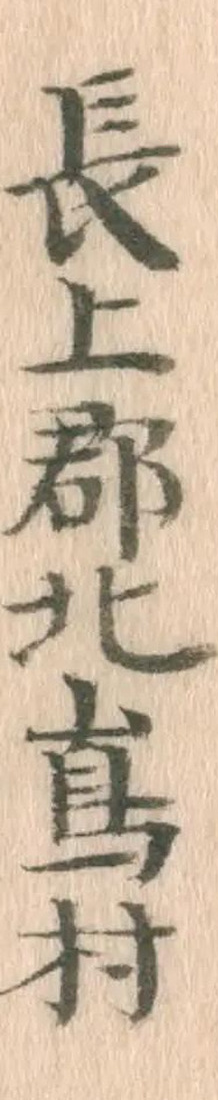長上郡北嶋村
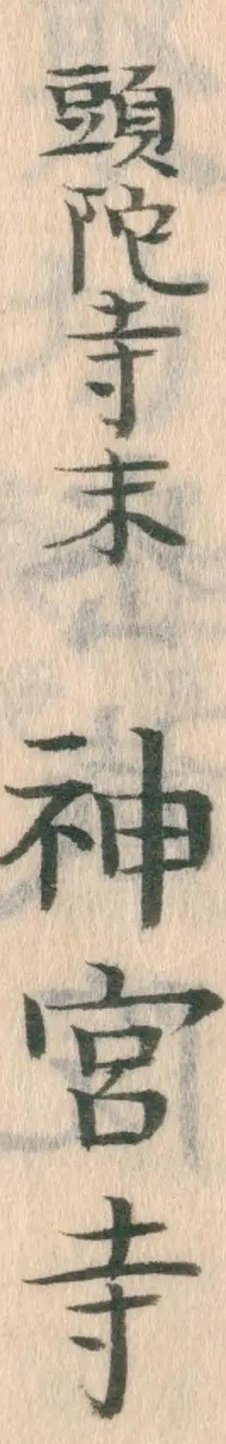頭陀寺未神宮寺
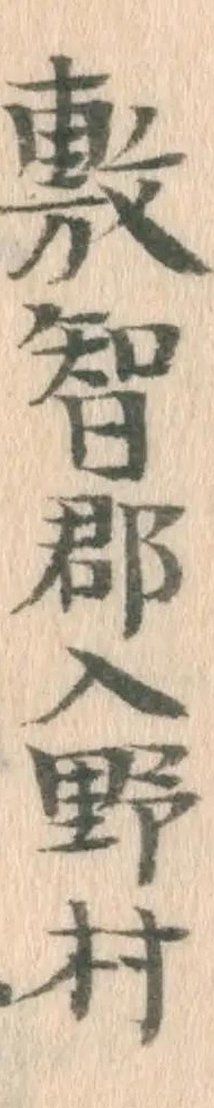敷智郡入野村
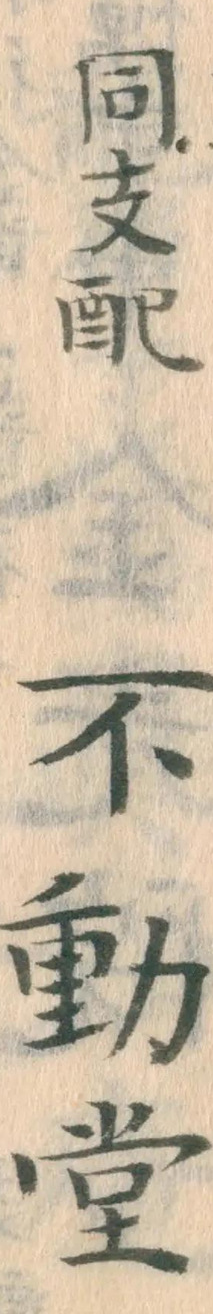同支配不動堂

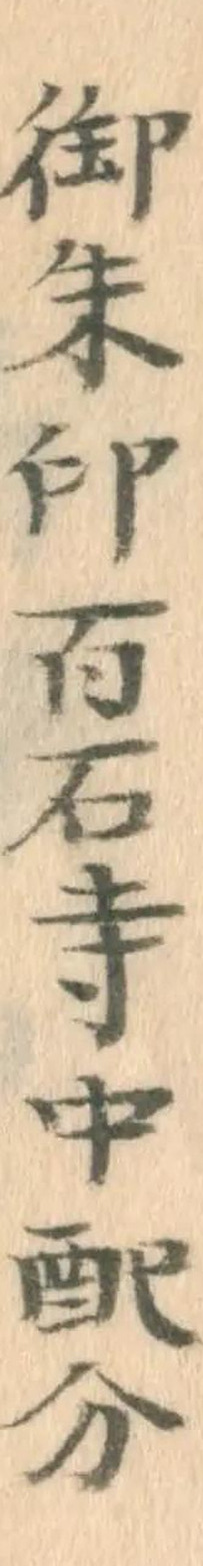御朱印百石寺中配分
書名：古義真言宗本末帳 21巻. [4] 第三 伊賀国、伊勢国、志摩国、尾張国、三河国、遠江国、駿河国、伊豆国、甲斐国
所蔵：国立国会図書館 National Diet Library, JAPAN
